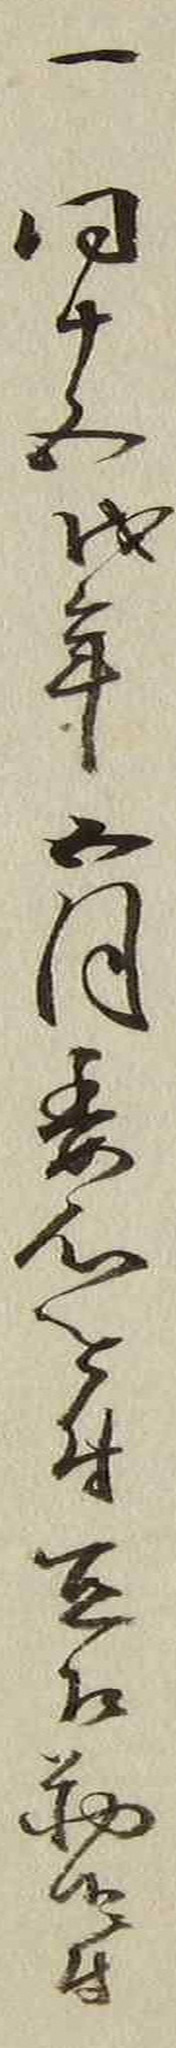一同十五戌年五月委心を付宜相勤候ニ付
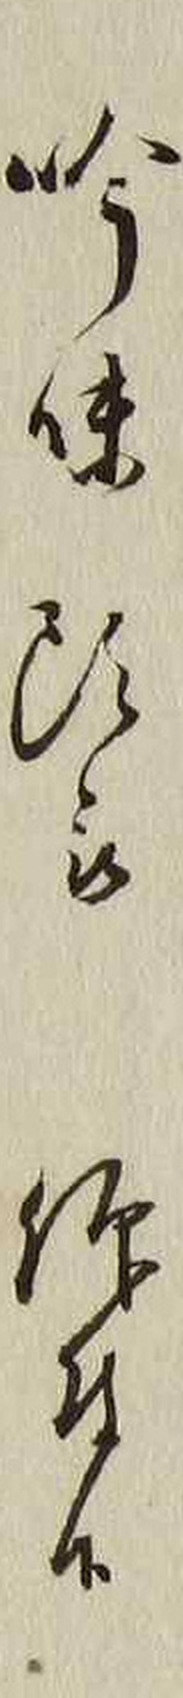吟味頭被仰付候
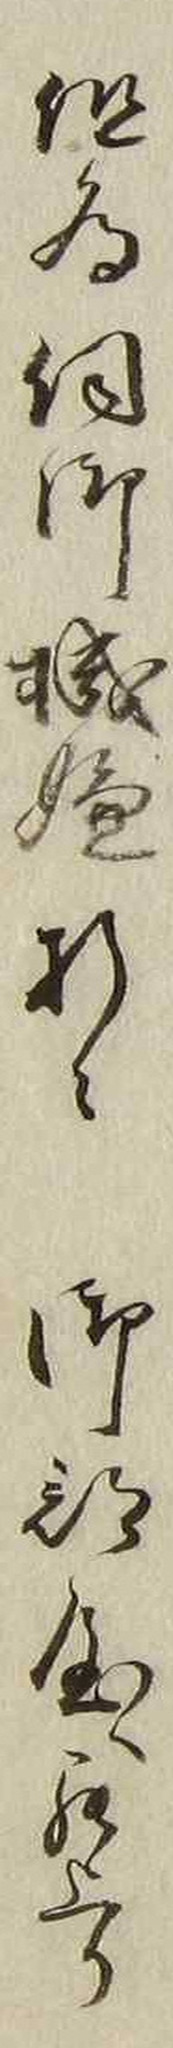但為伺御機嫌折々御部屋へ罷上り
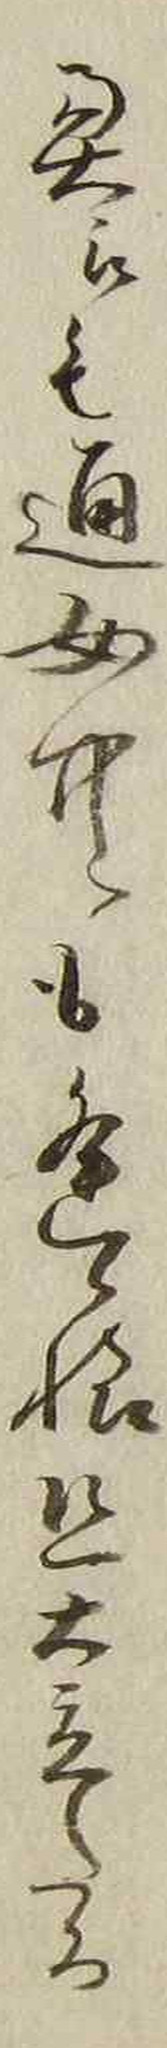奥江も通女中へも逢候様且大立たる

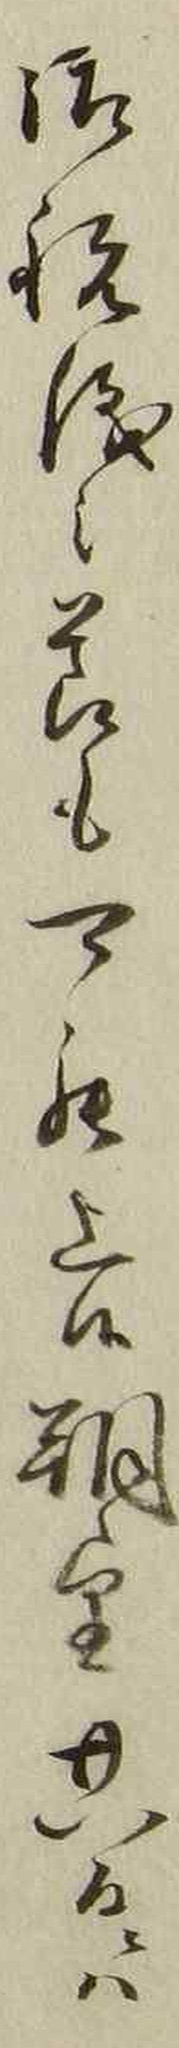御祝儀之節も可罷上候朔望廿八日ニハ
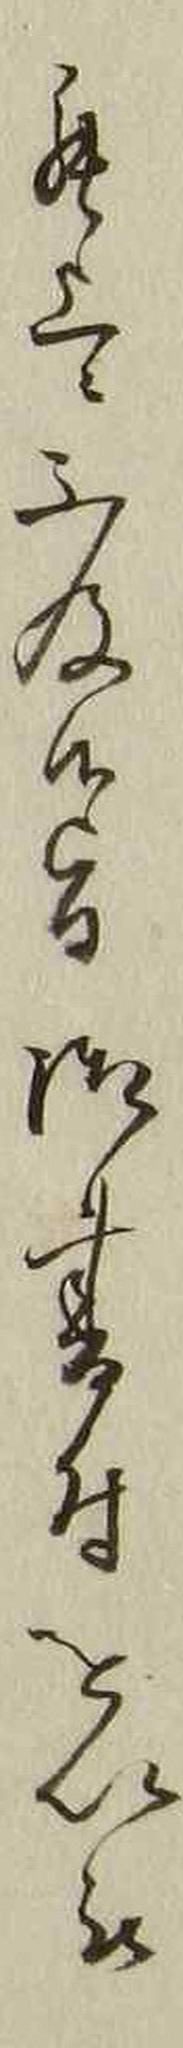罷上ニ不及候旨御書付を以被
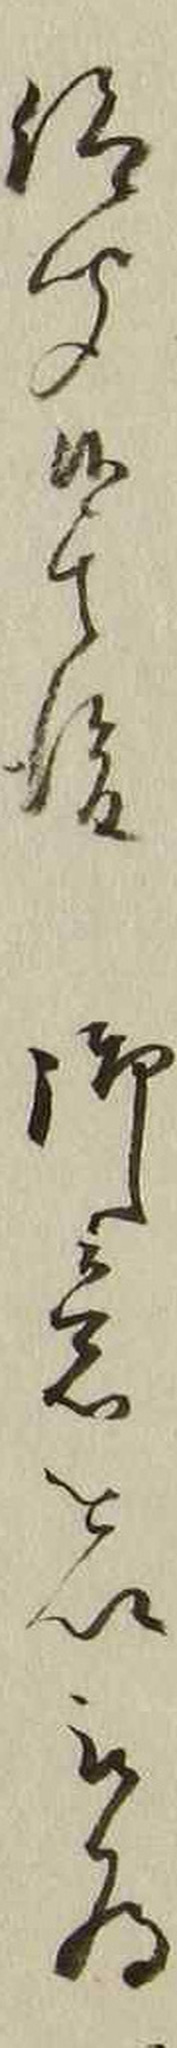仰聞候其後御意を以被為
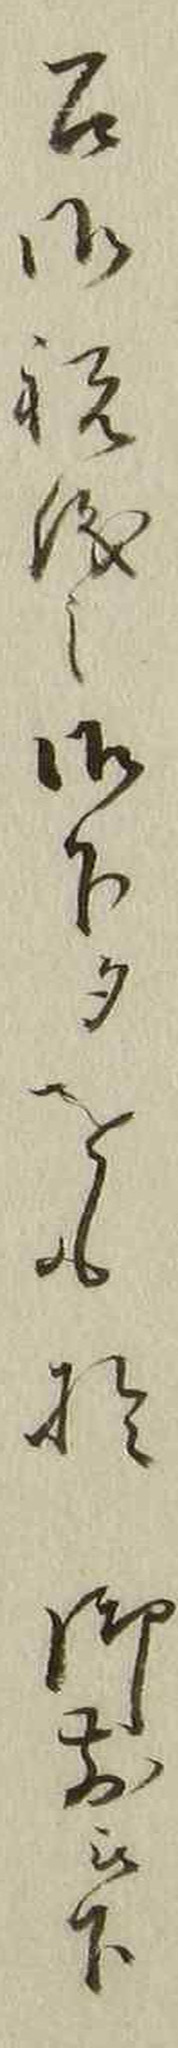召御祝儀之御下タをも於御前被下
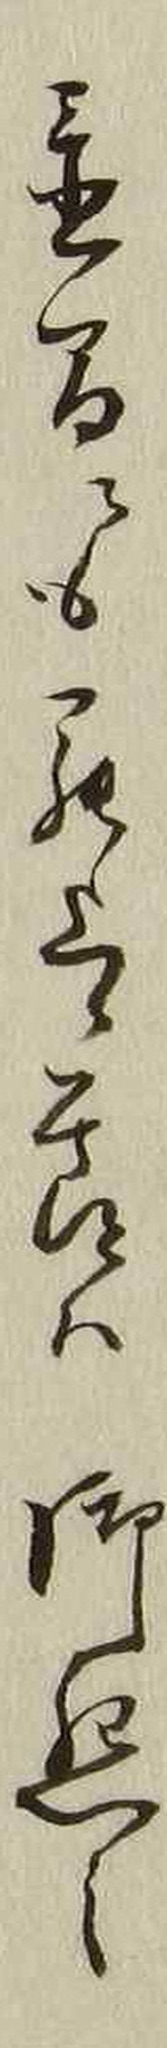置間ニも罷上候節ハ御懇之
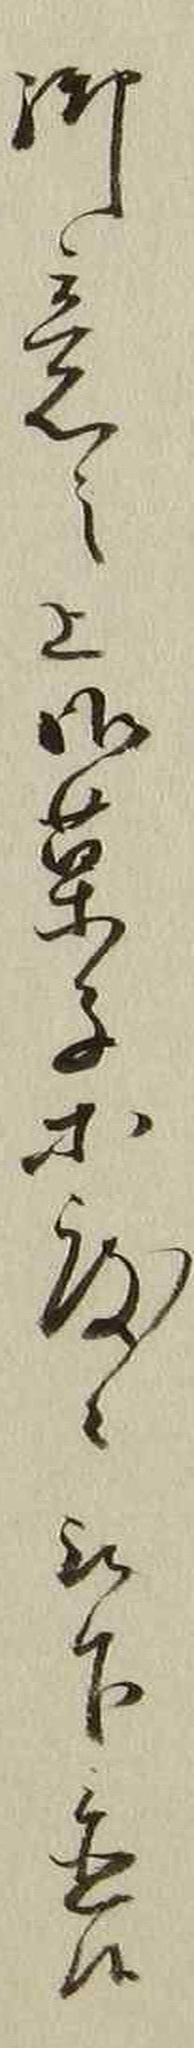御意之上御菓子等度々被下置候
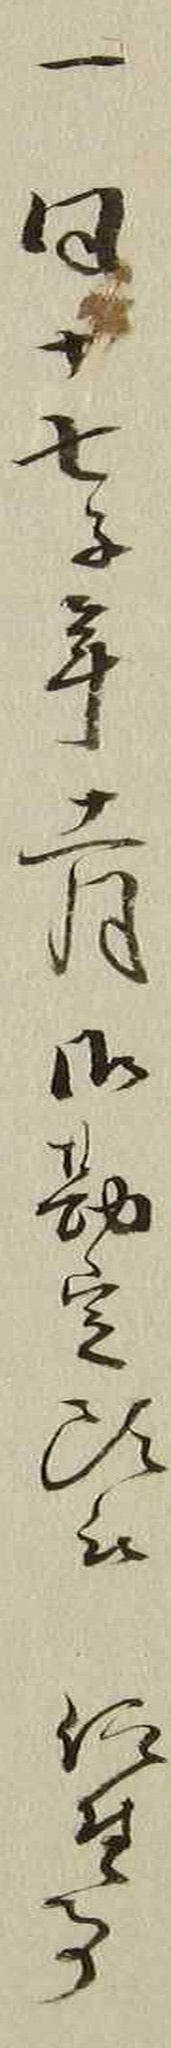一同十七子年十一月御勘定頭被仰付候事
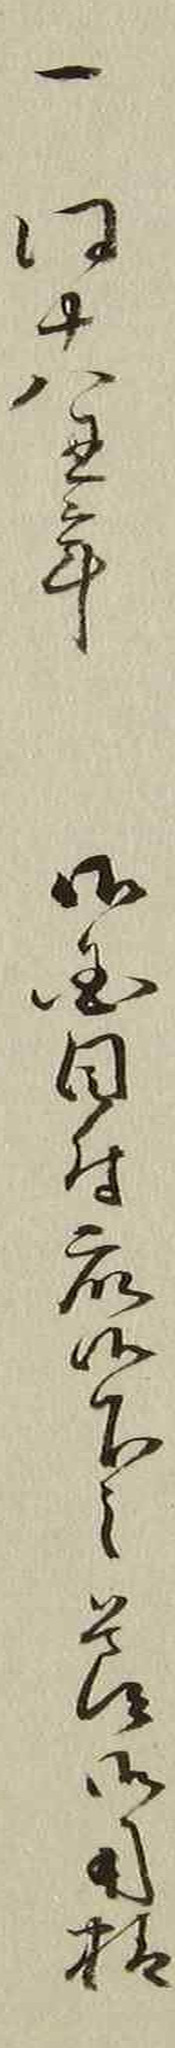一同十八丑年御国目付衆御下之節御用精
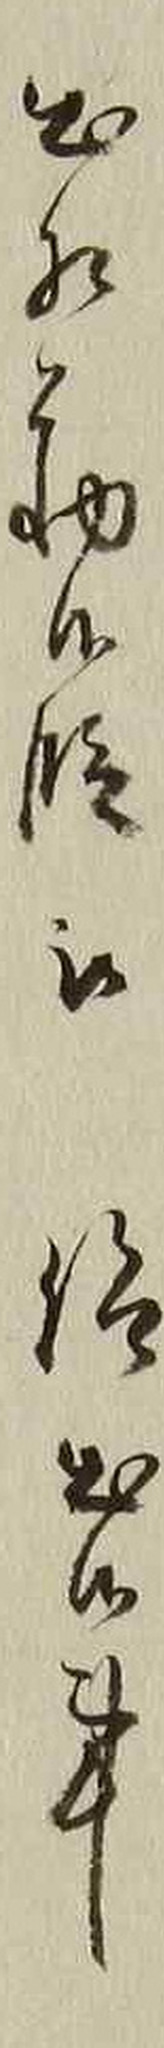出相勤候段被仰出候事
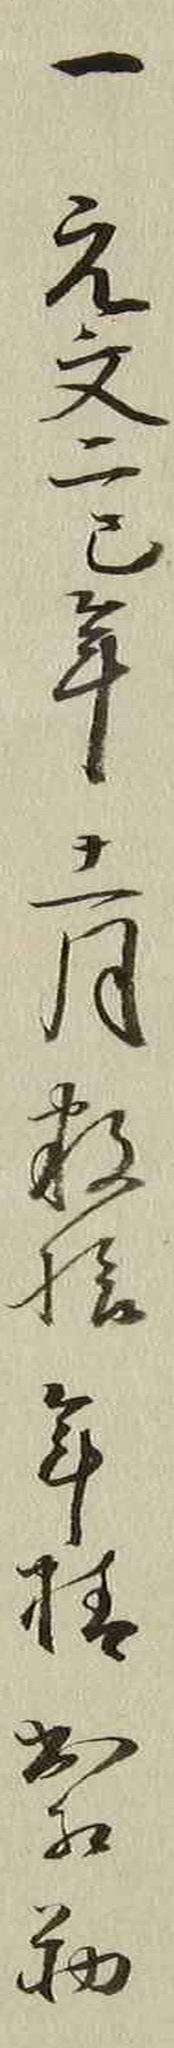一元文二巳年十一月数拾年精出相勤
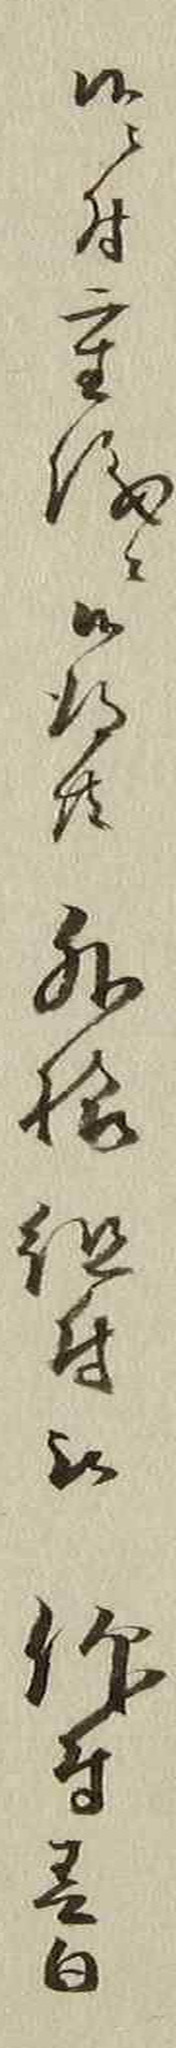候ニ付重儀ニ候得共外様組付被仰付春日
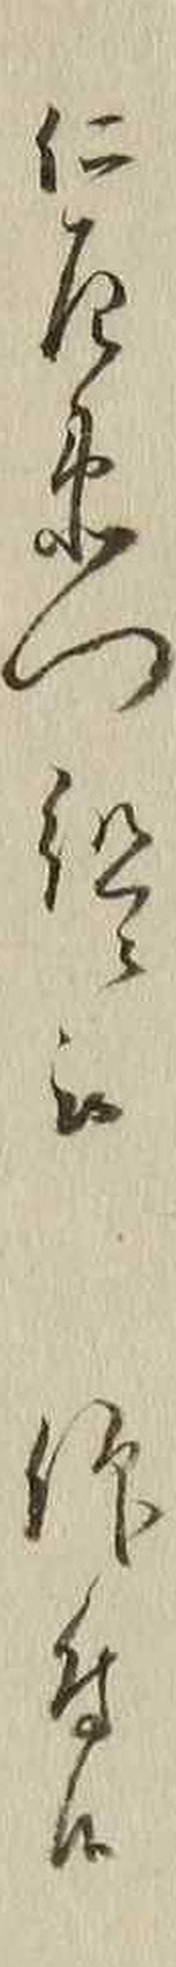仁左衛門組ニ被仰付候
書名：諸士系譜　巻之28　い之部28
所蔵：会津若松市立会津図書館
